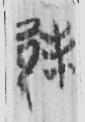邦
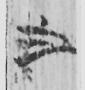之
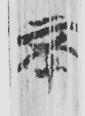不
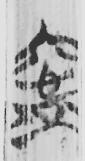{穴心皿}（寧）
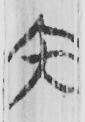內
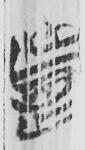良
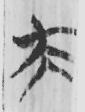夫
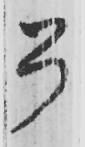乃
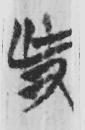拃（作）
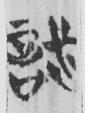䛑
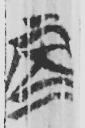再
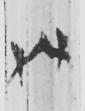夂
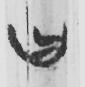曰
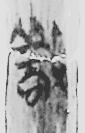敬
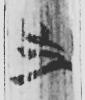之
